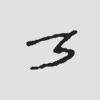乃
